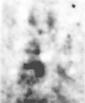黃
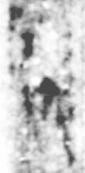馭（御）
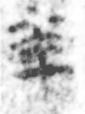車
